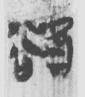欲
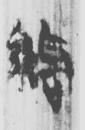紿
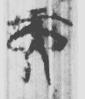而
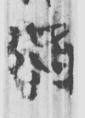欲
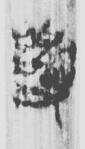亂
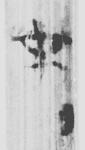才
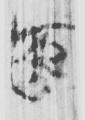医
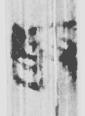取
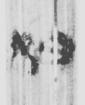相
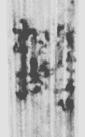灋
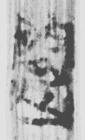{興止}
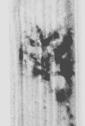未
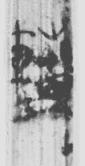{車屮留土}
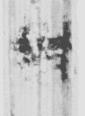於
